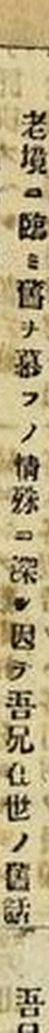老境ニ臨ミ𦾔ヲ慕フノ情殊ニ深シ因テ吾兄在世ノ𦾔話
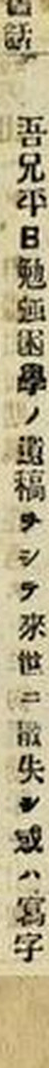吾兄平日勉強困學ノ遺稿ヲシテ來世ニ散失シ或ハ寫字
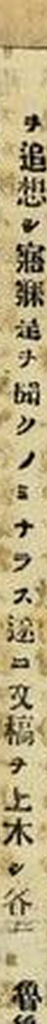ヲ追想シ窹寐是ヲ聞クノミナラス遂ニ文稿ヲ上木シ各
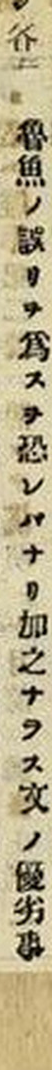魯魚ノ誤リヲ爲スヲ恐レバナリ加之ナラス文ノ優劣事
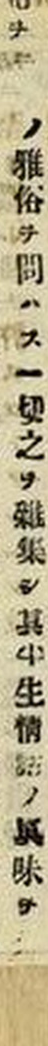ノ雅俗ヲ問ハス一切之ヲ雜集シ其平生情話ノ眞味ヲ
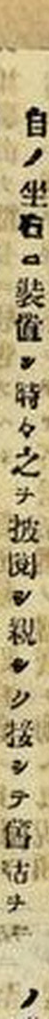自ノ坐右ニ装置シ時々之ヲ披閲シ親シク接シテ𦾔話ヲ
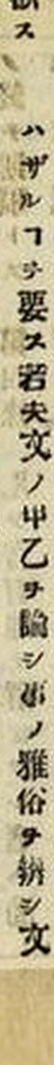ハザルヿヲ要ス若夫文ノ甲乙ヲ論シ事ノ雅俗ヲ辨シ文
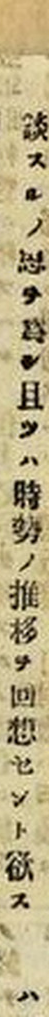談スルノ思テ爲シ且ツハ時勢ノ推移ヲ回想セント欲ス
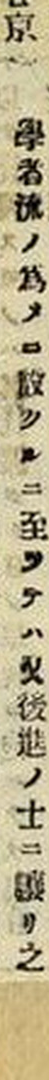學者流ノ爲メニ設クルニ至ラテハ又後進ノ士ニ譲リ之
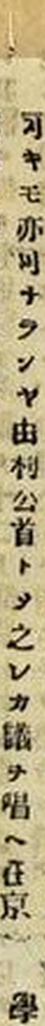可キモ亦可ナランヤ由利公首トシテ之レカ議ヲ唱ヘ在京
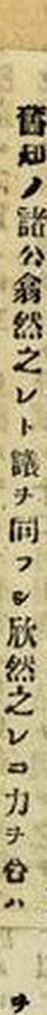𦾔知ノ諸公翁然之レト議ヲ同フシ欣然之レニ力ヲ合ハ
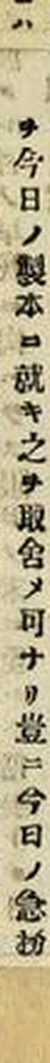ヲ今日ノ製本ニ就キ之ヲ取舎シテ可ナリ豈ニ今日ノ急務
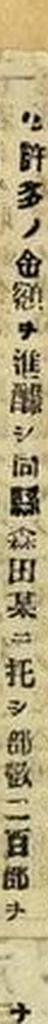セ許多ノ金額ヲ進醸シ同縣森田某ニ托シ部數二百部ヲ
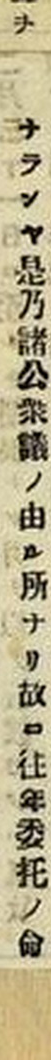ナランヤ是乃諸公衆議ノ由ル所ナリ故ニ往年委托ノ命
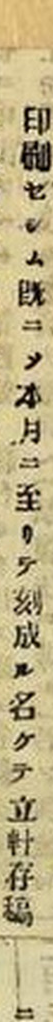印刷セシム既ニシテ本月似至リテ刻成ル名ケテ立軒存稿
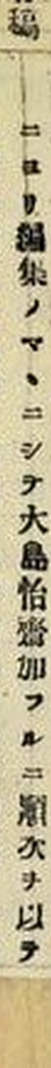ニヨリ編集ノマヽニシテ大島怡斎加フルニ次ヲ以テ
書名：温古集 四巻
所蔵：福井県文書館 Fukui Prefectural Archives
